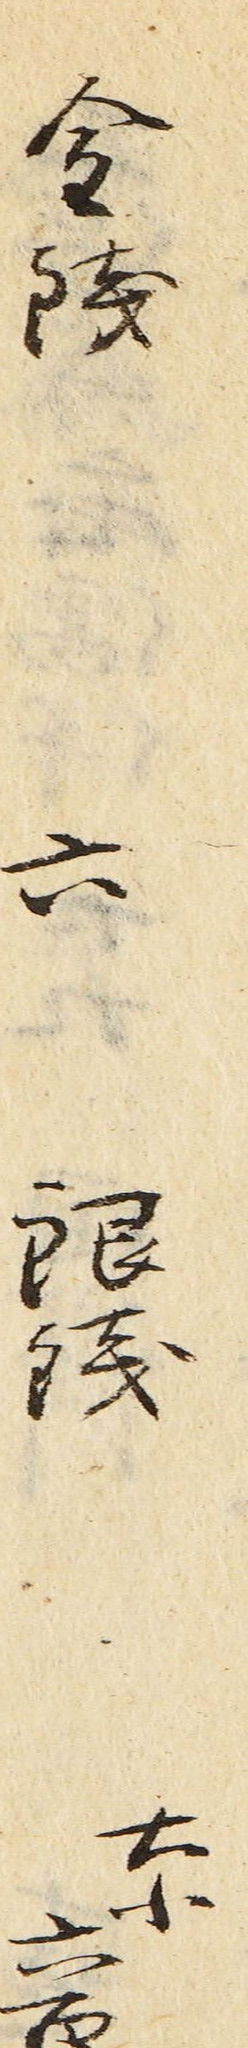金銭六銀銭大小六百九
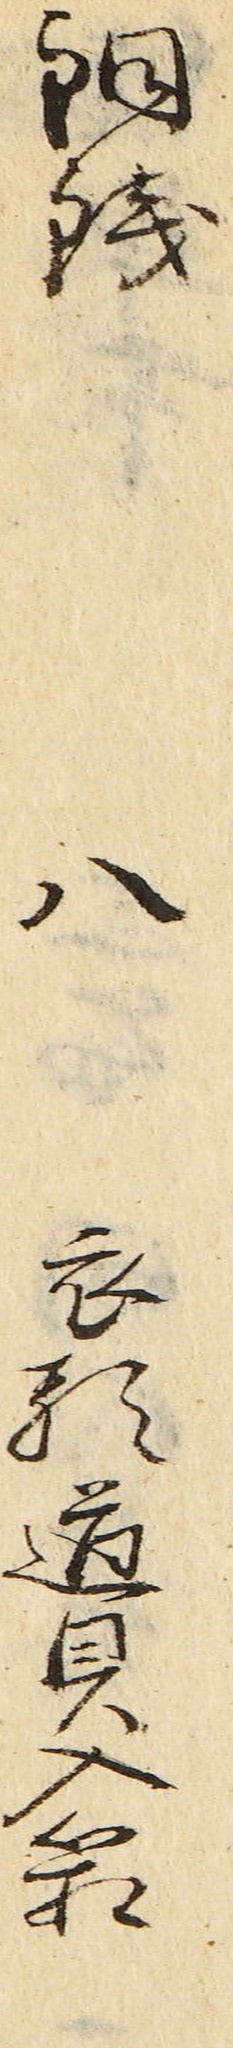銅銭八衣類道具入箱四
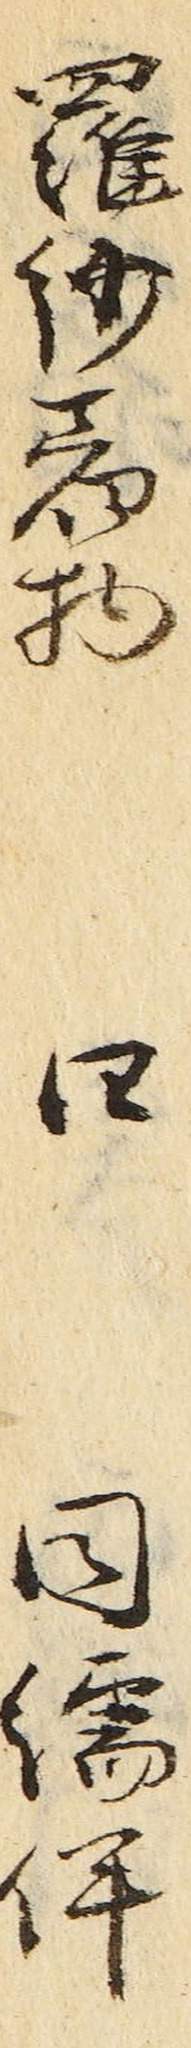羅紗着物四同襦袢三

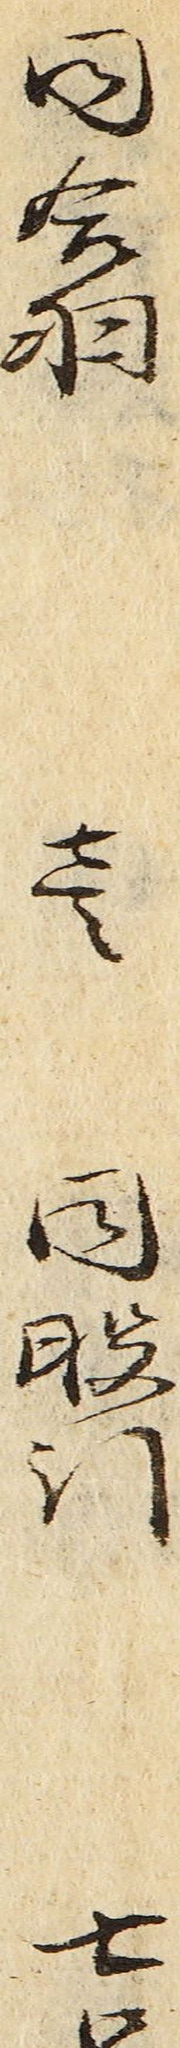同合羽壱同股引七足
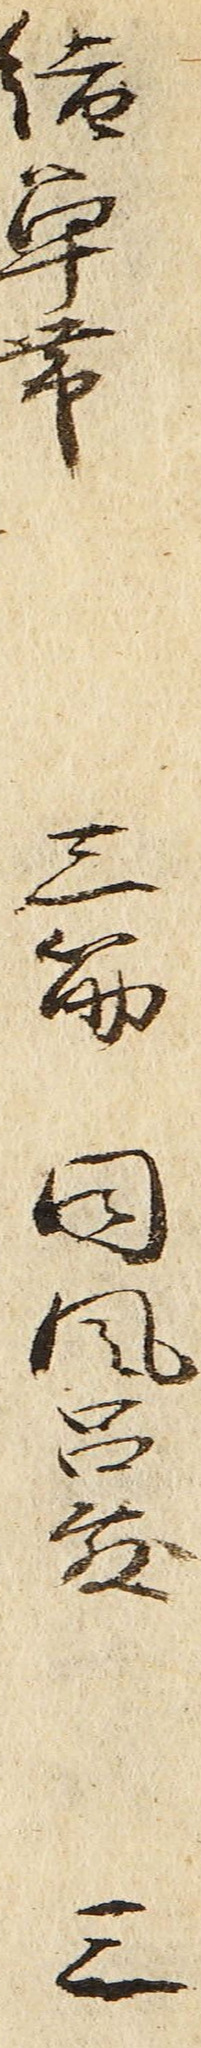絹単帯三筋同風呂敷三
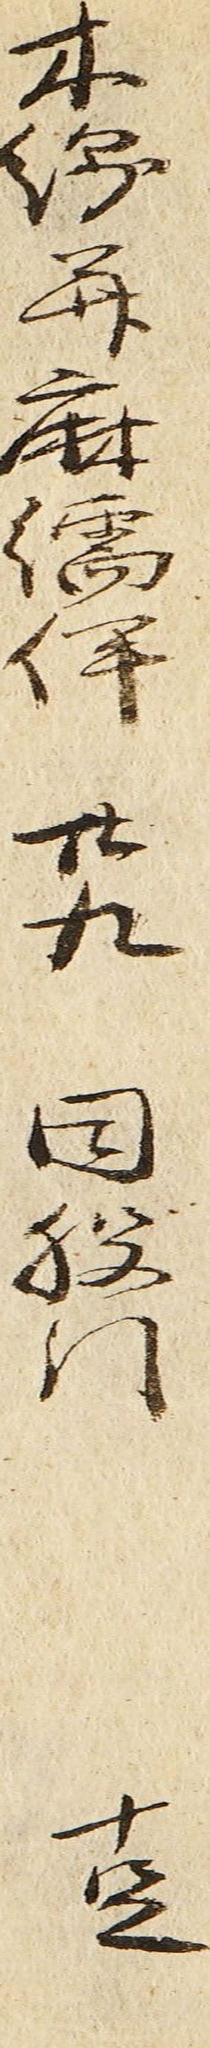木綿并麻襦袢廿九同股引十足
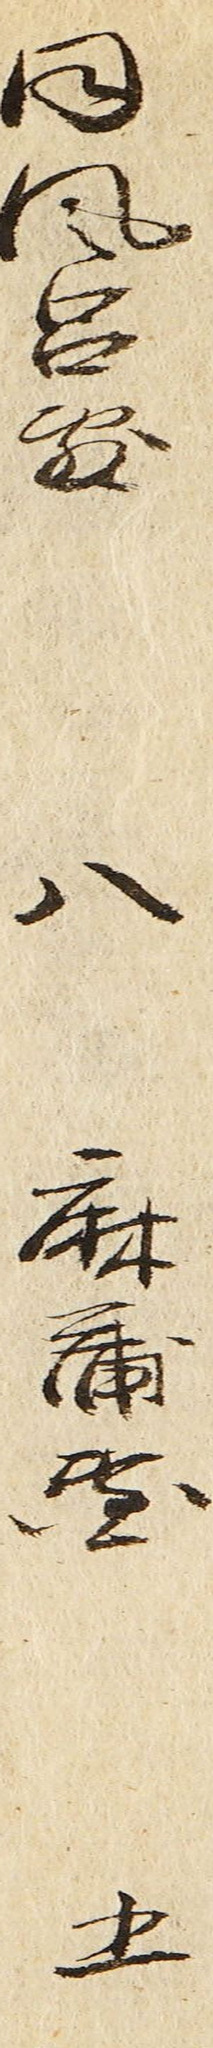同風呂敷八麻蒲団五
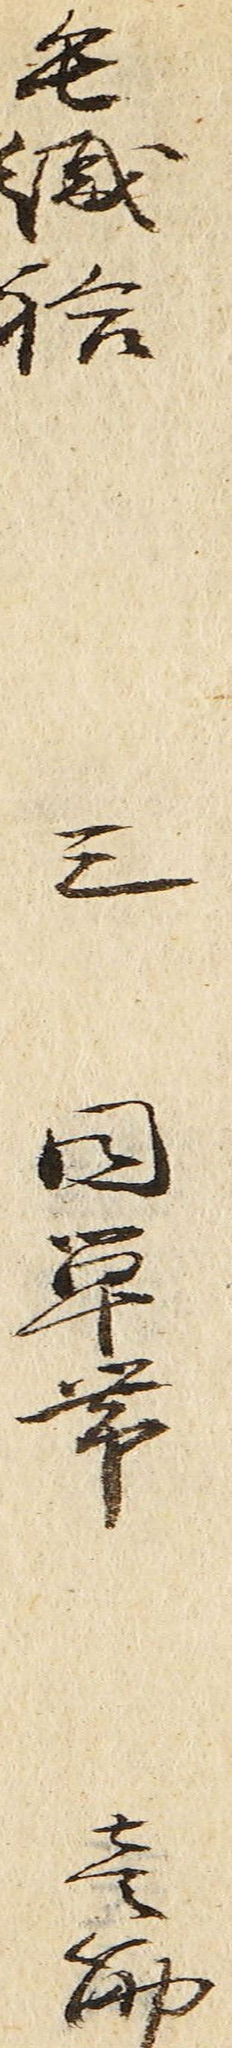毛織袷三同単帯壱筋
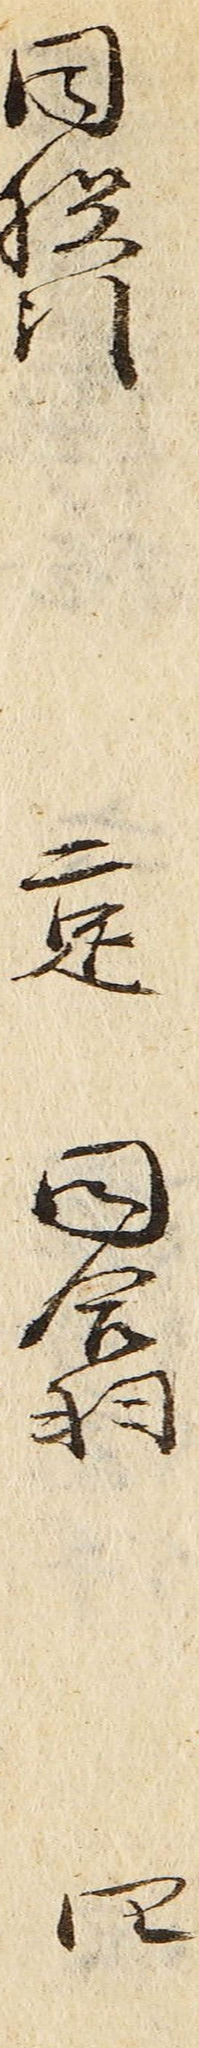同股引二足同合羽四
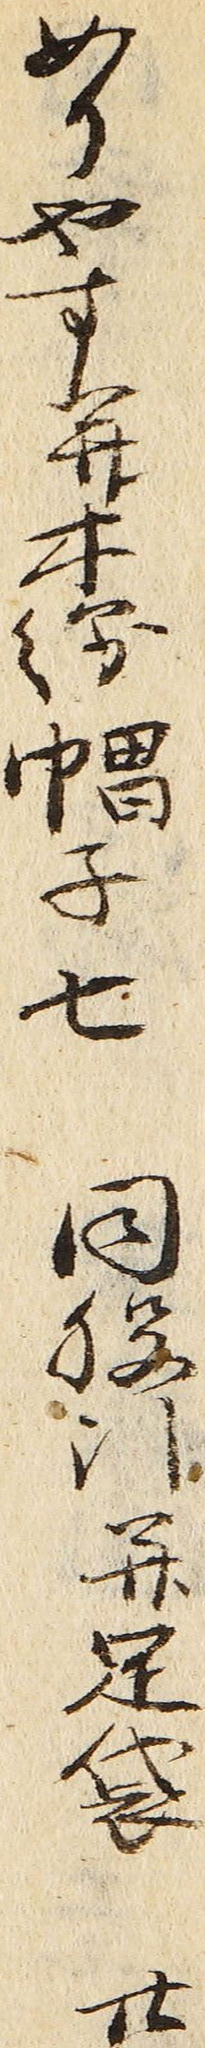めりやす并木綿帽子七同股引并足袋廿四足
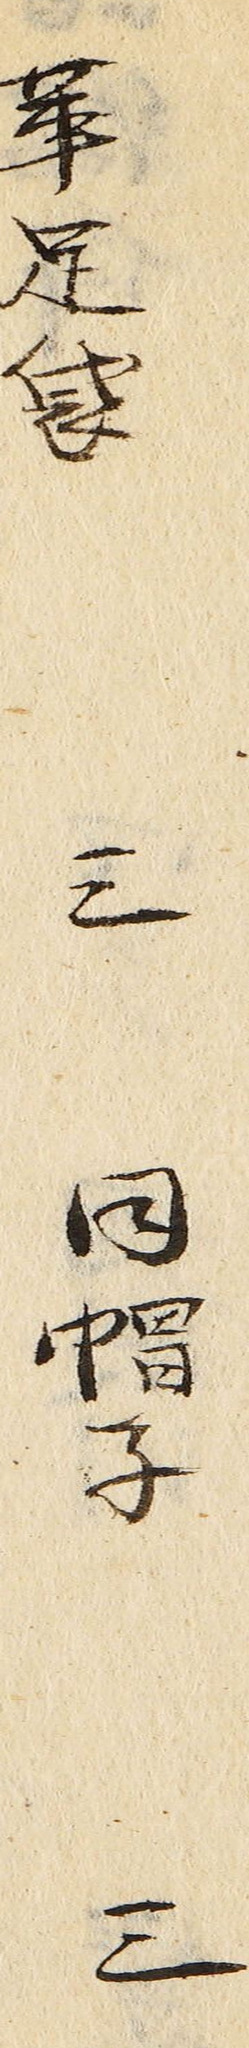革足袋三同帽子三
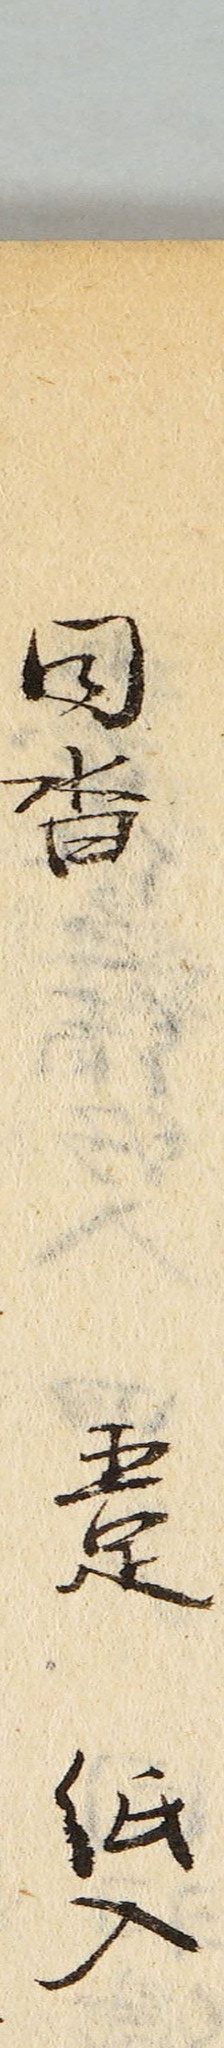同沓五足紙入四
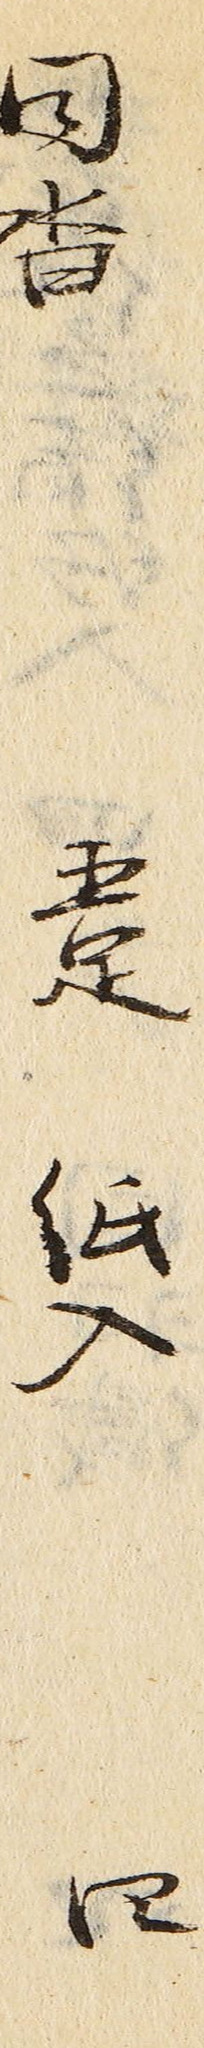同沓五足紙入四
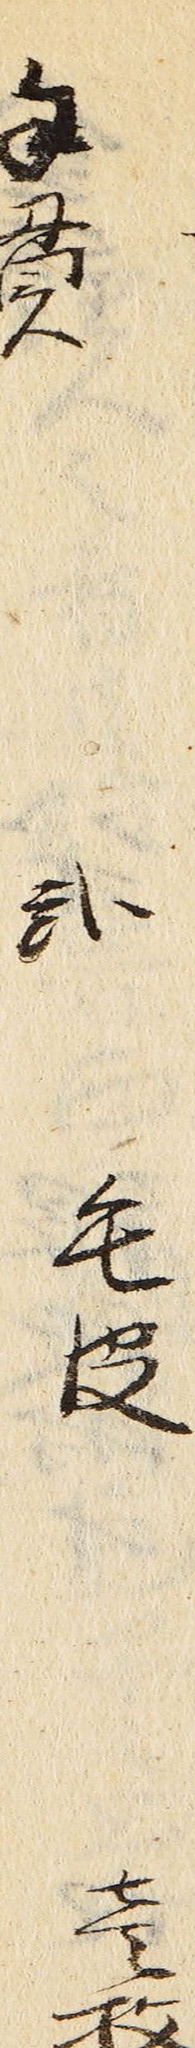手貫弐毛皮壱枚
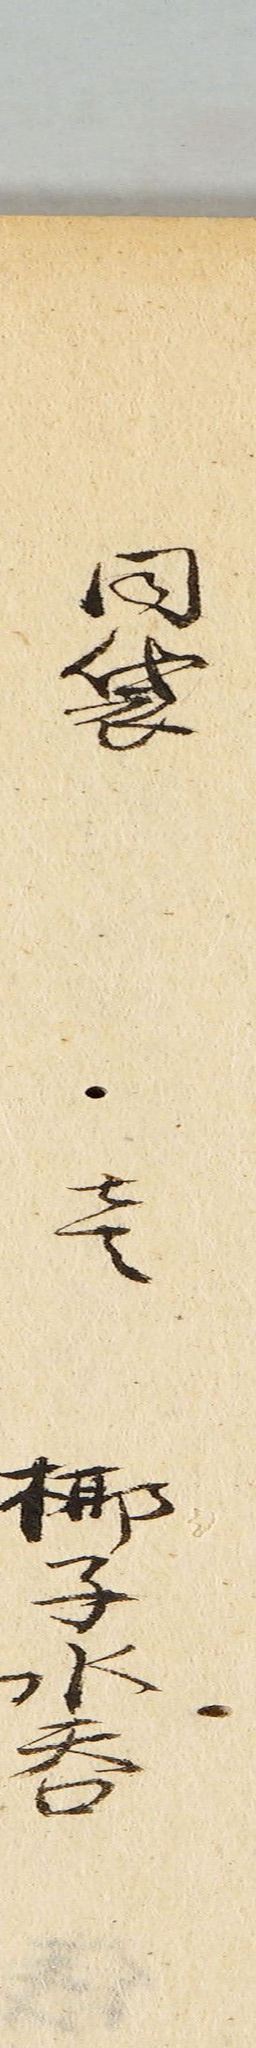同袋壱椰子水呑弐
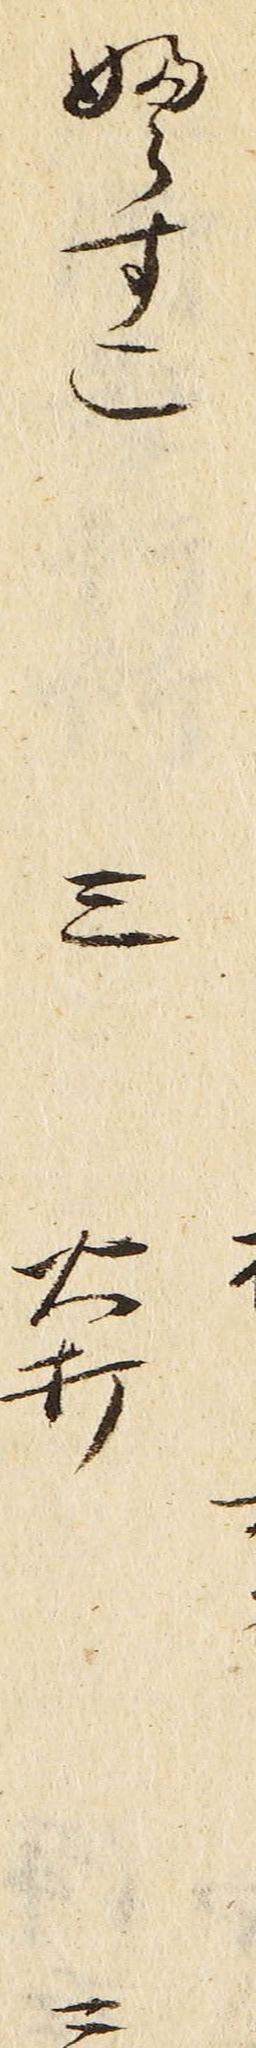ふらすこ三火打三
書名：漂民後記
